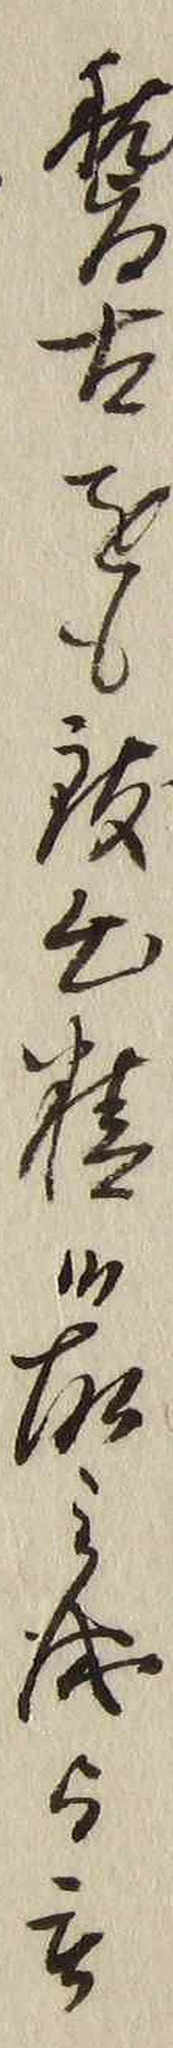稽古をも致出精候故之儀与被
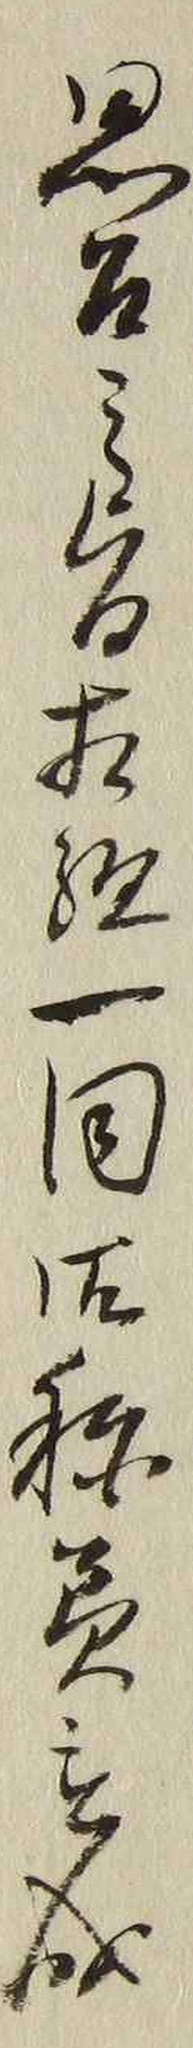思召之旨相組一同御称美被成
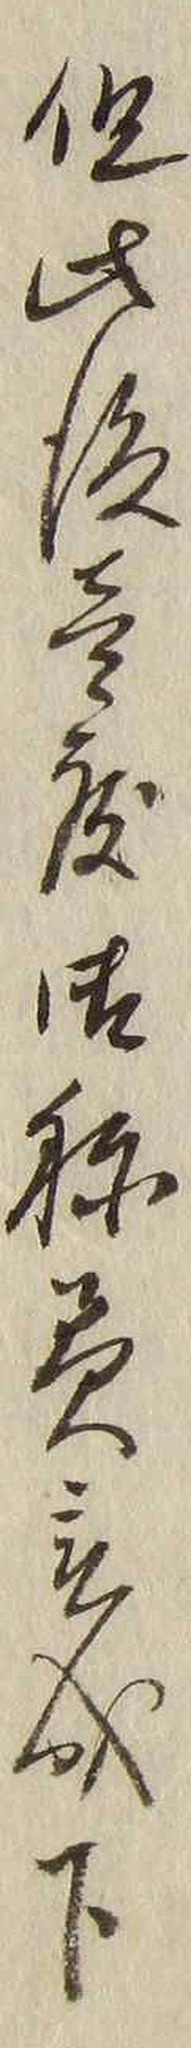但此後壱度御称美被成下

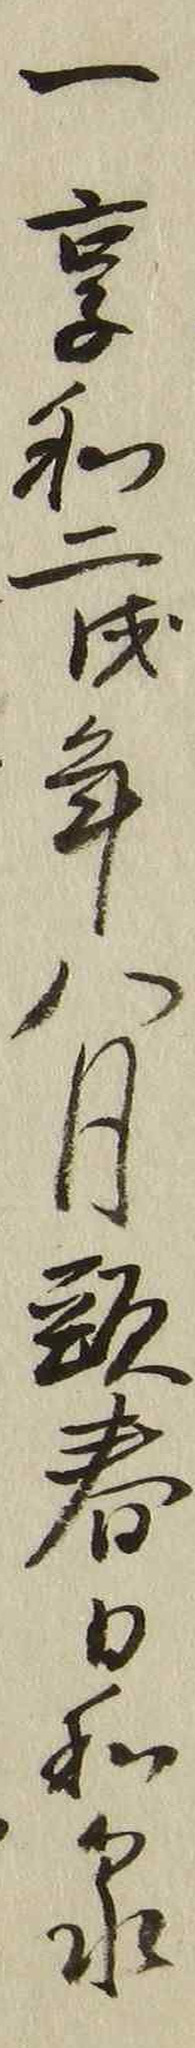一享和二戊年八月頭春日和泉
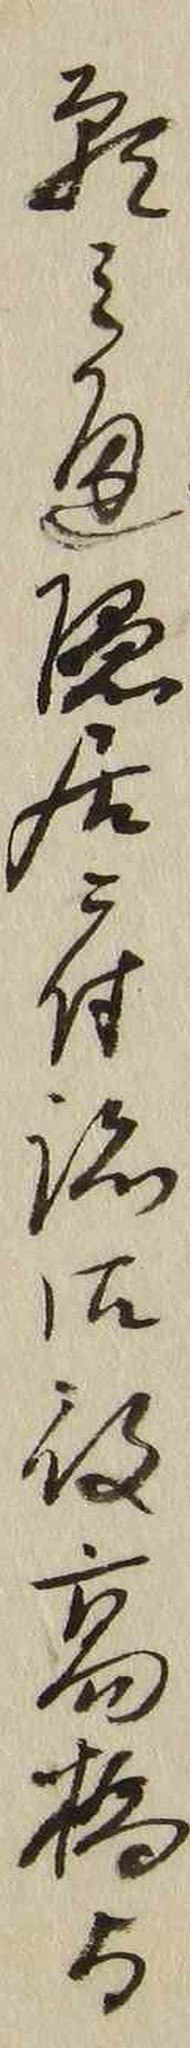願之通隠居ニ付跡御役高橋与
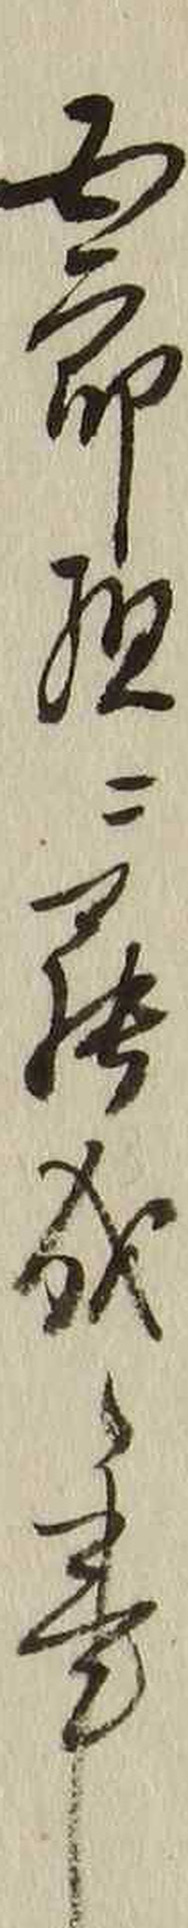五郎組ニ罷成候事
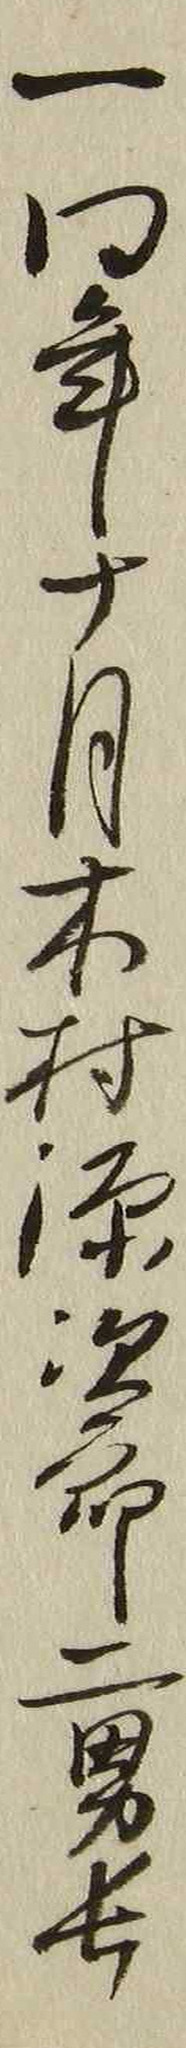一同年十月木村源次郎二男長
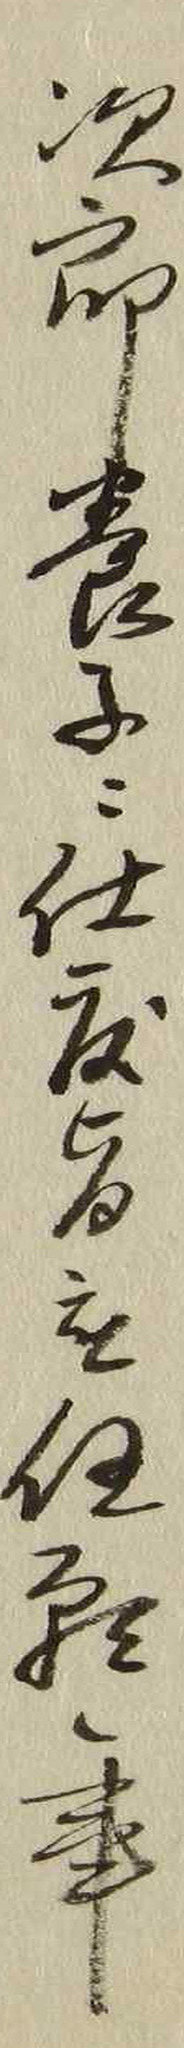次郎養子ニ仕度旨被任願候事
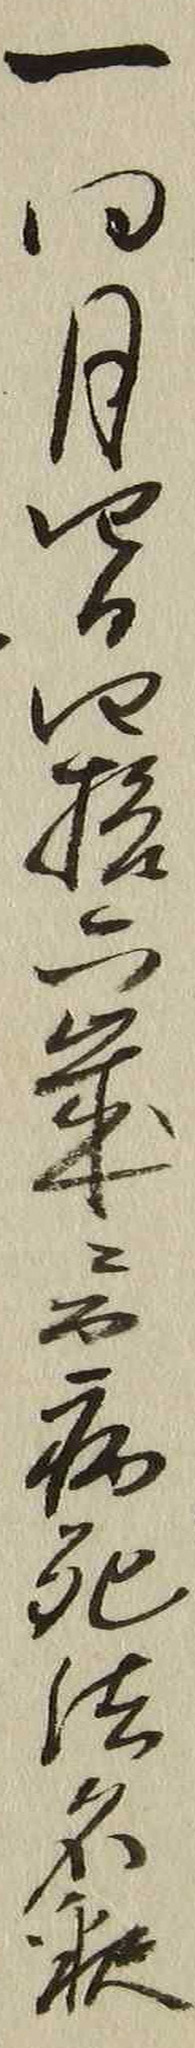一同月四日四拾六歳ニ而病死法名釈
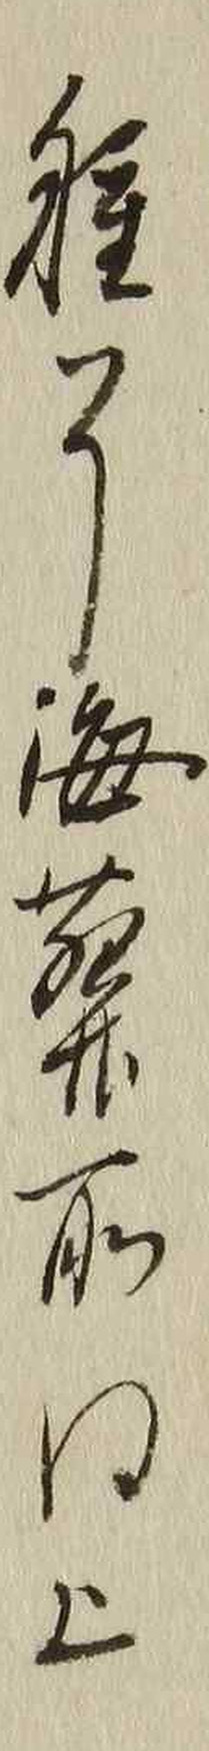種了海葬所同上
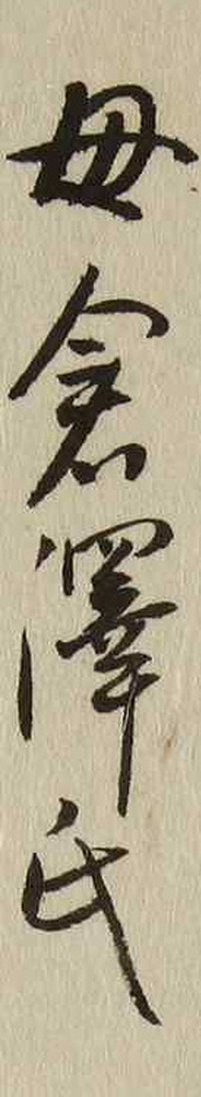母倉沢氏
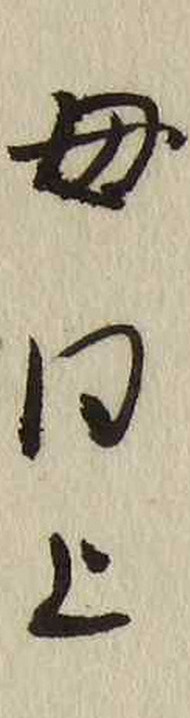母同上

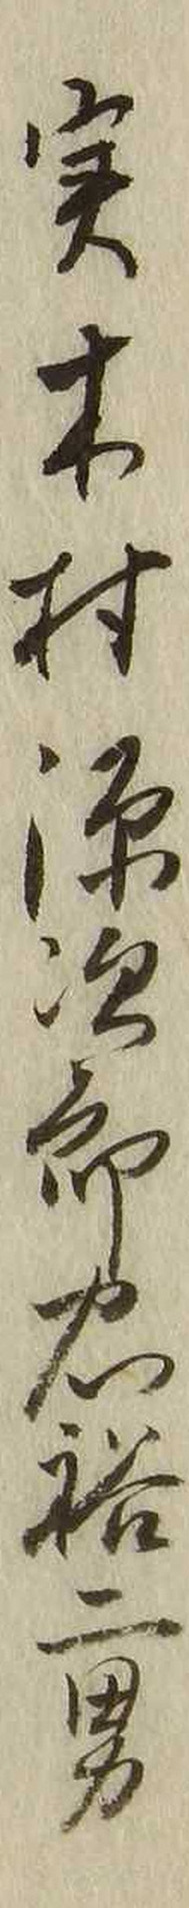実木村源次郎忠裕二男
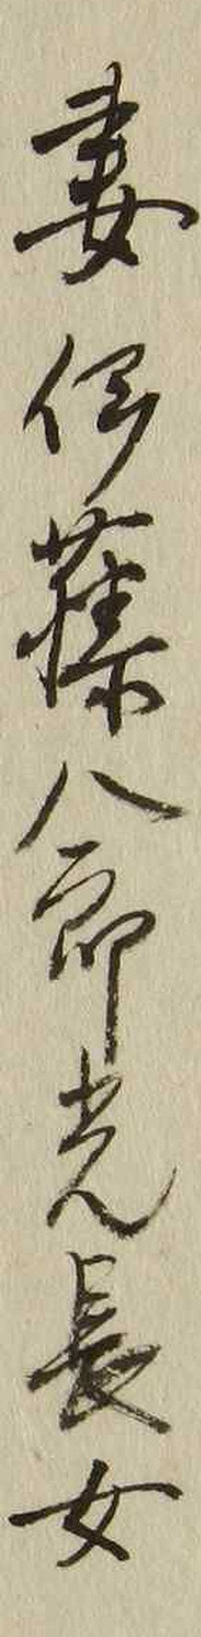妻伊藤八郎光長女
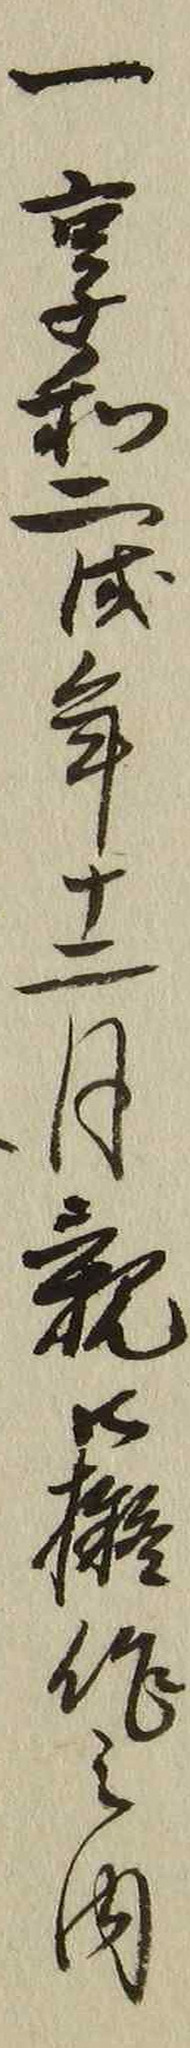一享和二戌年十二月親御擬作之内
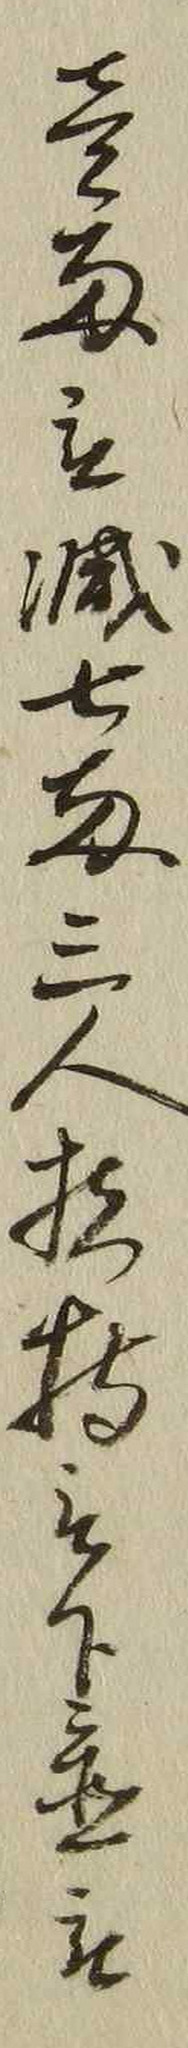壱両被減七両三人扶持被下置被
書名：諸士系譜　巻之359　す之部9
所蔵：会津若松市立会津図書館
